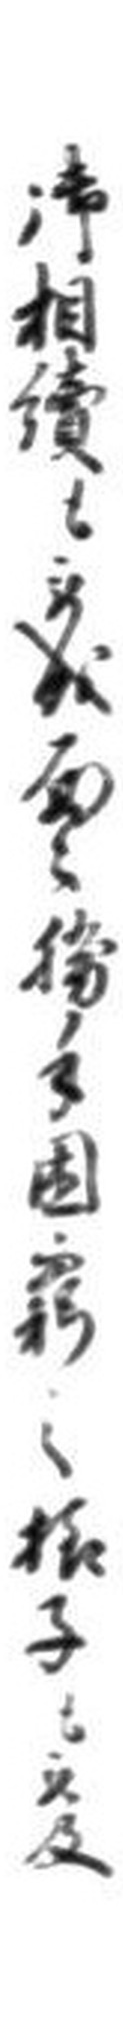御相続も被成面々勝手困窮之様子も被及
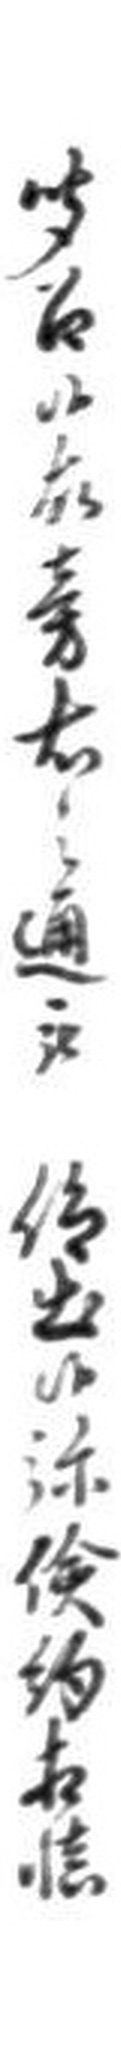聞召候故旁右之通被仰出候弥倹約相慎
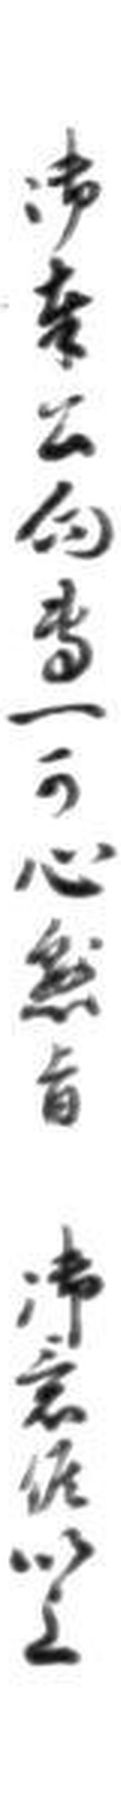御奉公向専一可心懸旨御意候以上
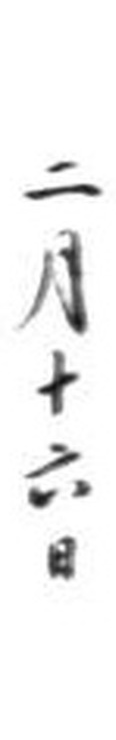二月十六日
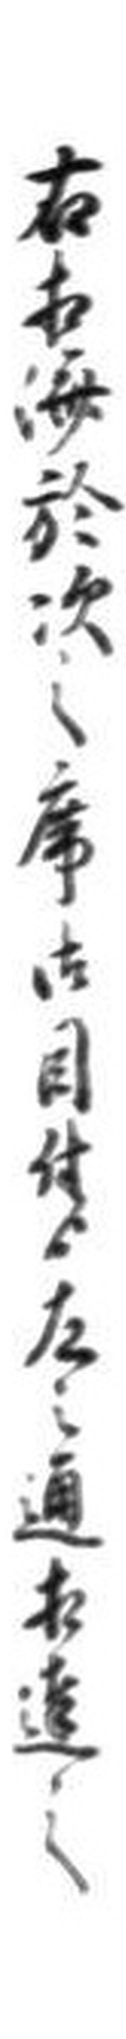右相済於次之席御目付ゟ左之通相達之
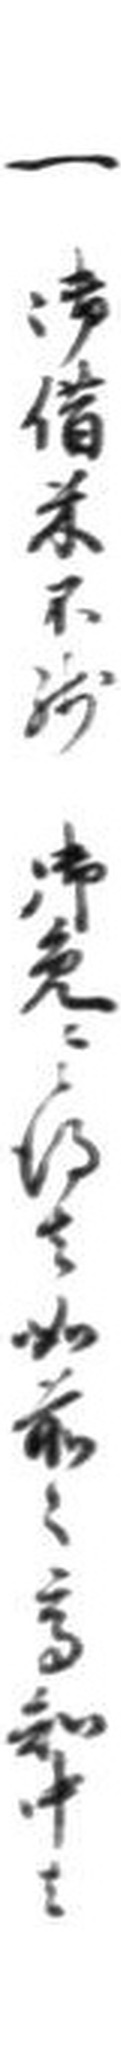一御借米不残御免ニ候得者如前々高知中者

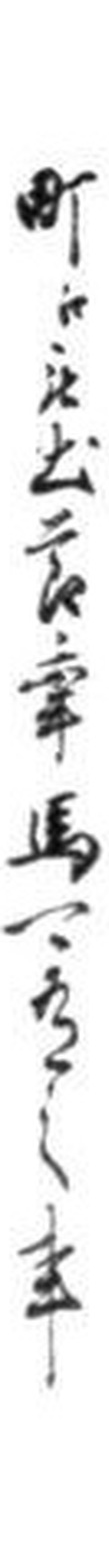町江被出節牽馬可有之事
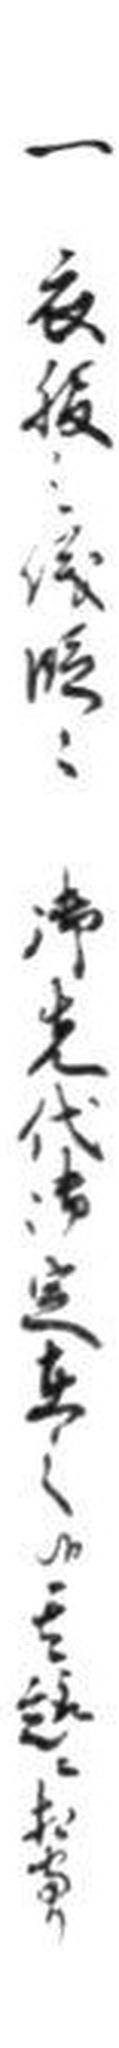一衣服之儀段々御先代御定在之候其趣ニ相守り
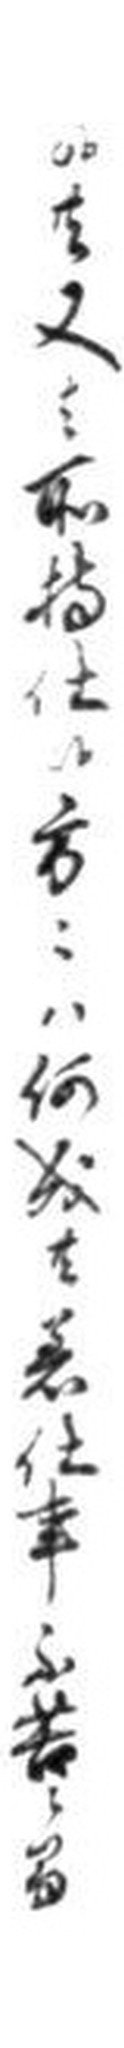候共又者所持仕候方ニハ何成共着仕事不苦候間
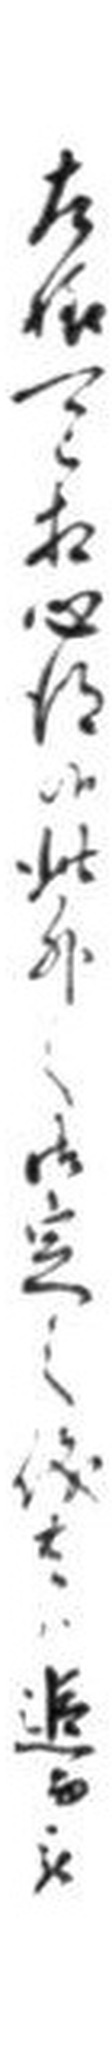左様可被相心得候此外之御定之儀共ハ追而被
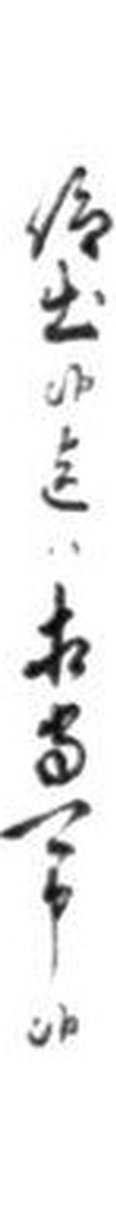仰出候迄ハ相守可申候
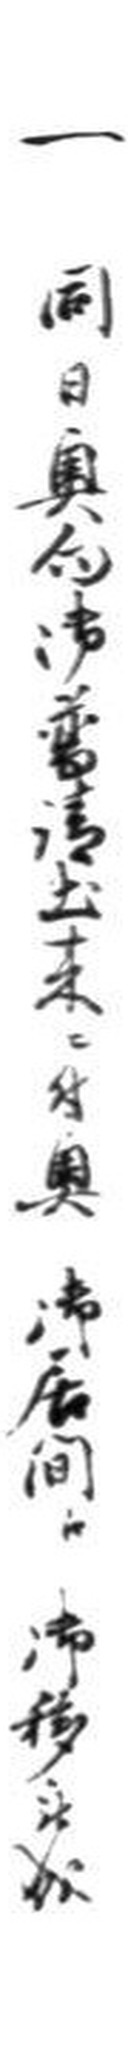一同日奥向御普請出来ニ付奥御居間江御移り被成
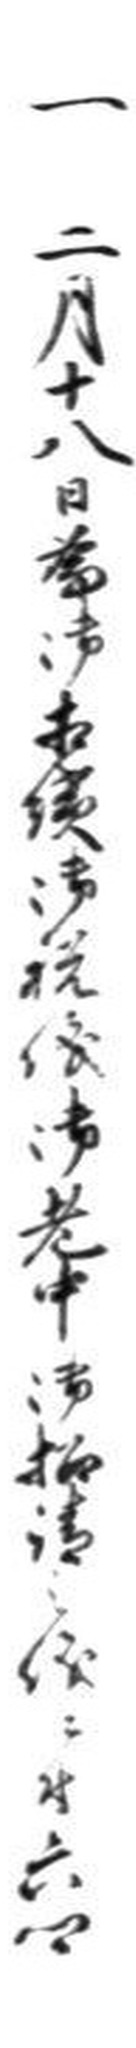一二月十八日為御相続御祝儀御老中御招請之儀ニ付六郷
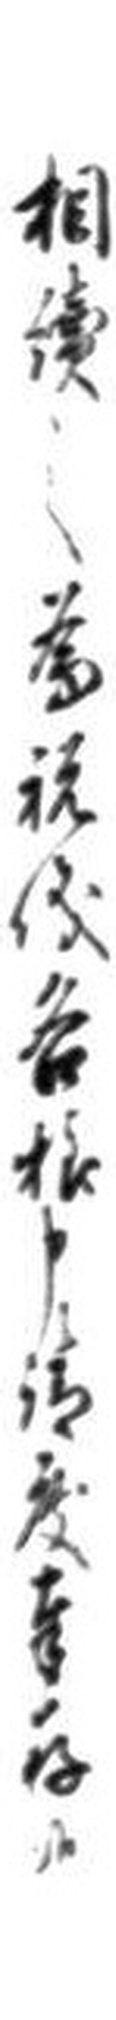相続之為祝儀各様申請度奉存候
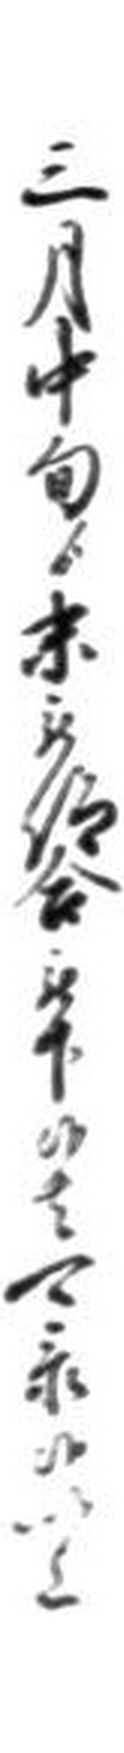三月中旬ゟ末被仰合被下候者可承候以上
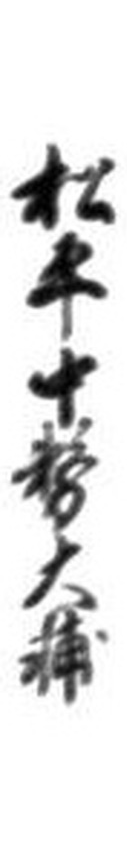松平中務大輔
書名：家譜 三十五 宗昌公 従享保六年到同七年
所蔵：福井県文書館 Fukui Prefectural Archives
